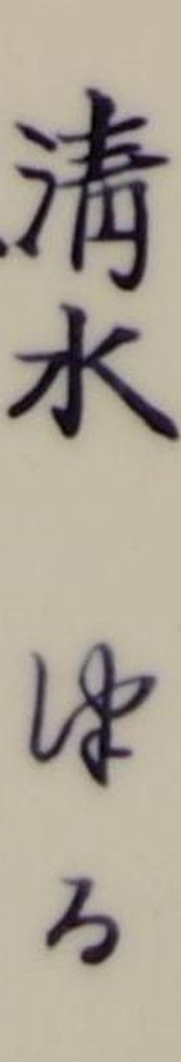清水つる
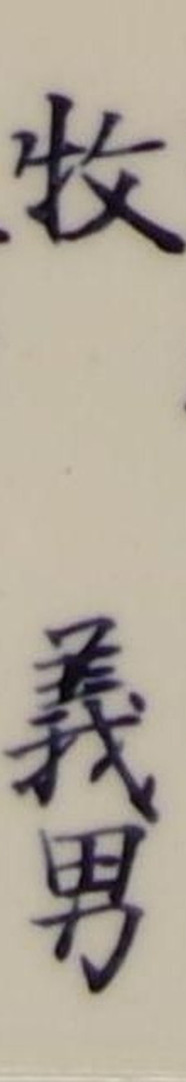牧義男
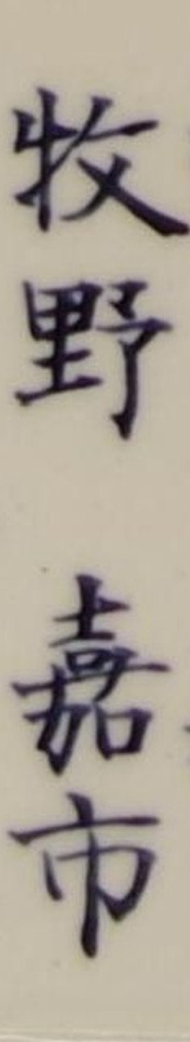牧野嘉市
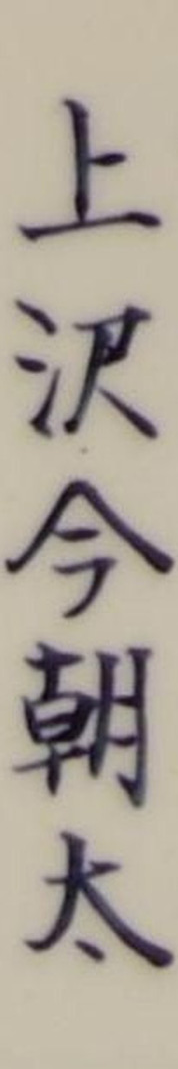上沢今朝太
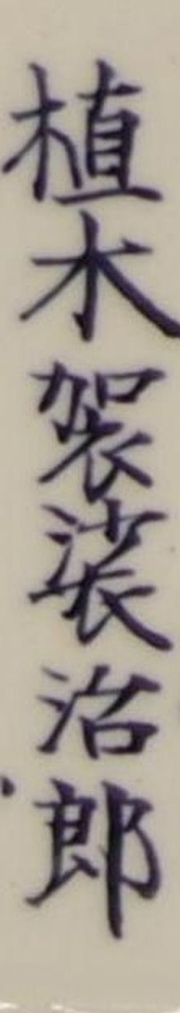植木袈裟治郎
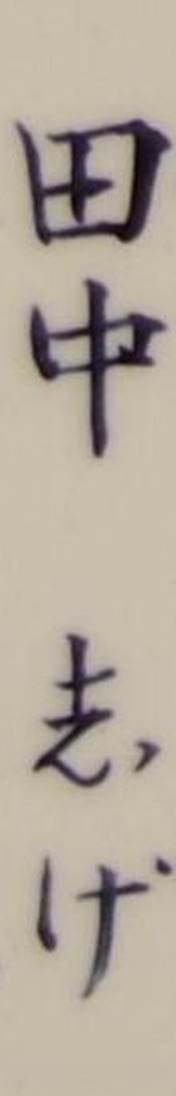田中しげ
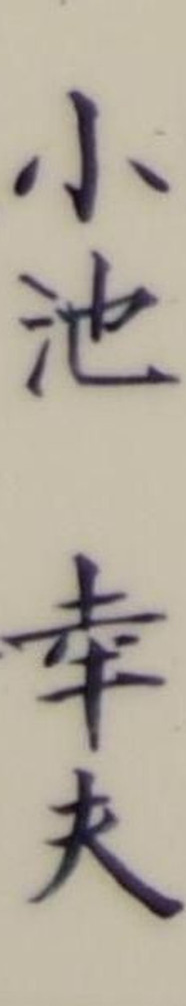小池幸夫
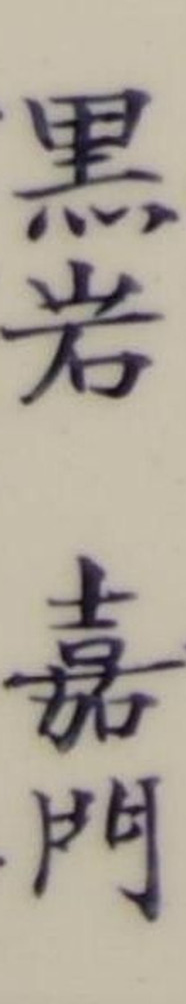黒岩嘉門
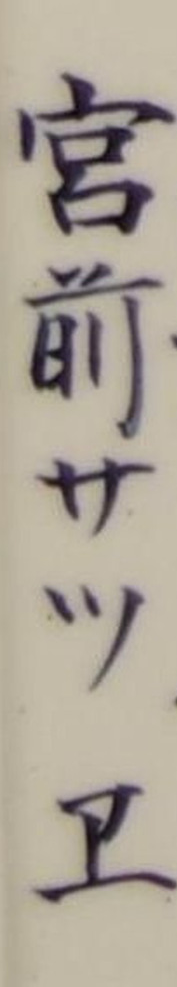宮前サツヱ

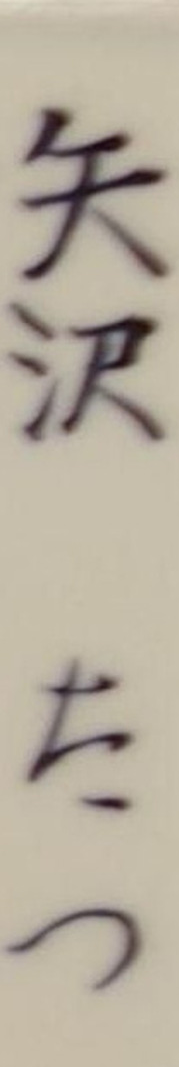矢沢たつ
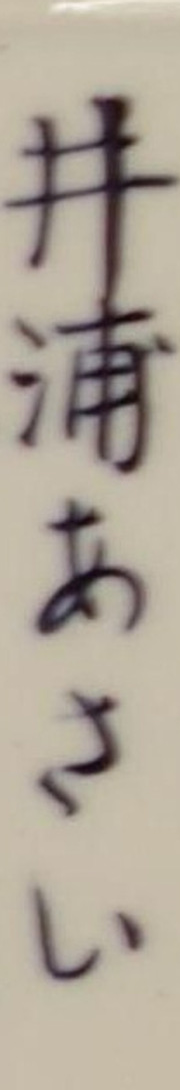井浦あさい
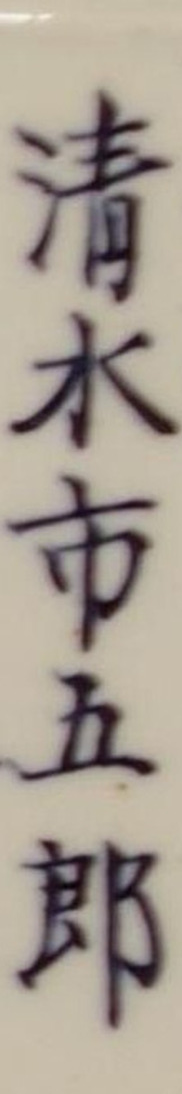清水市五郎
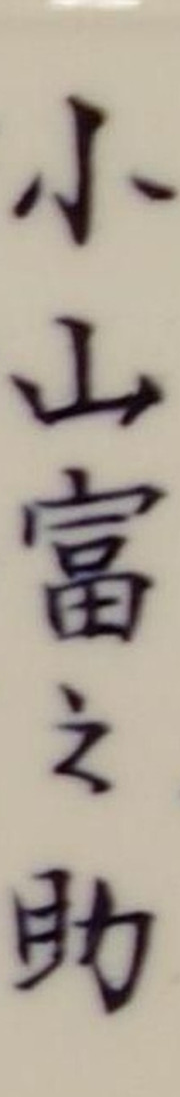小山富之助
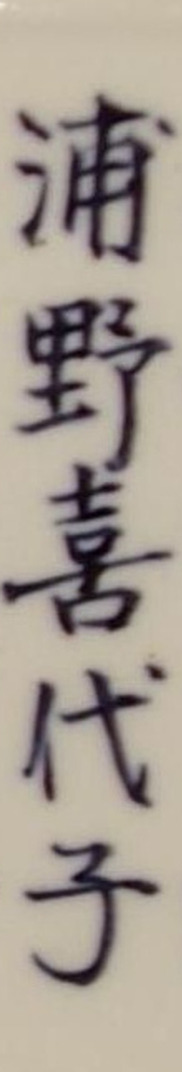浦野喜代子
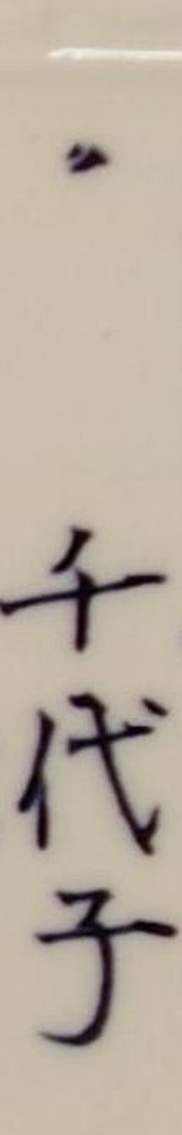千代子
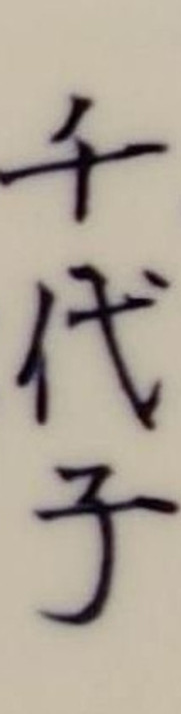千代子
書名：E~L
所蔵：高野山金剛峯寺
